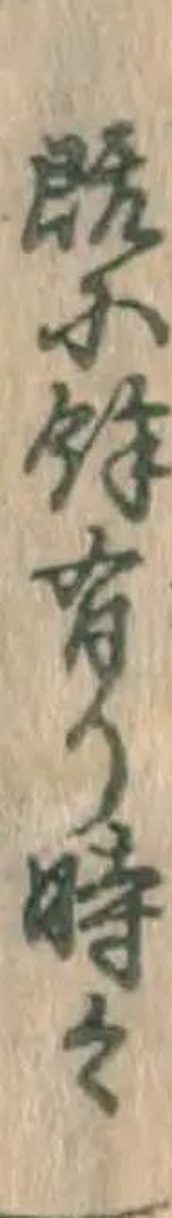既に余有り時々
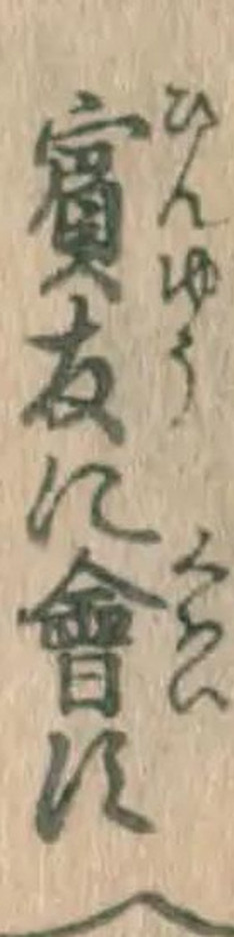賓友に会す
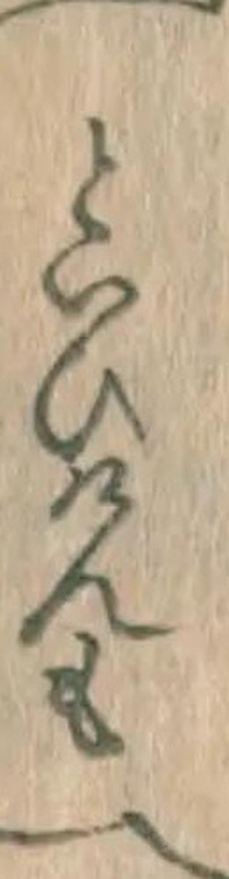といひけんも
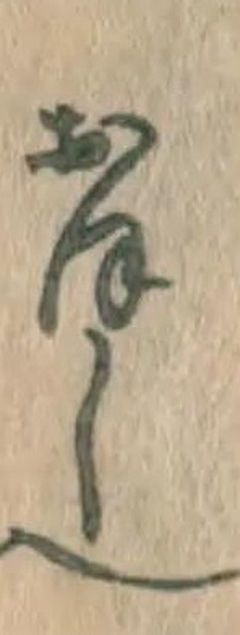おほし

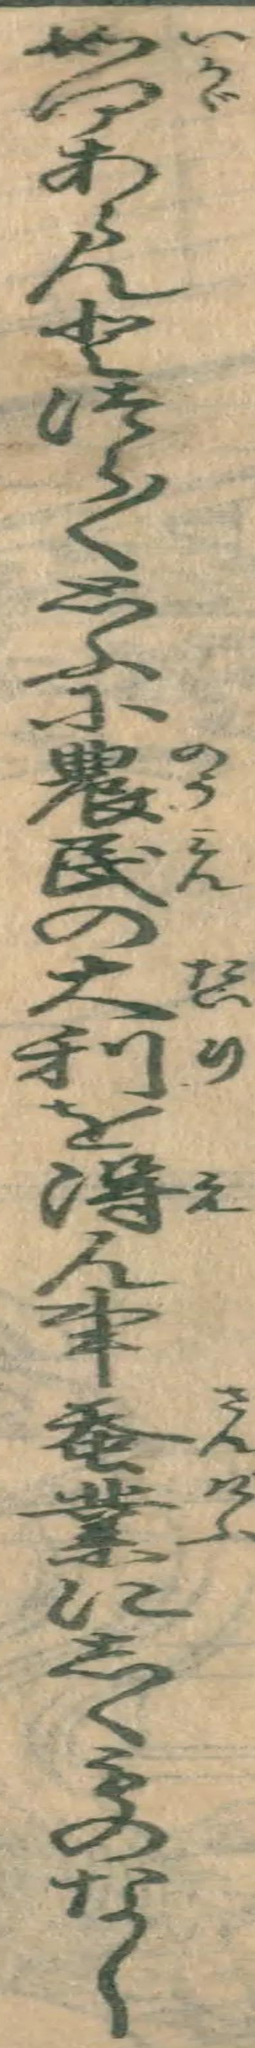如何あらんとつら〳〵思ふに農民の大利を得ん事蚕業にしくものなし
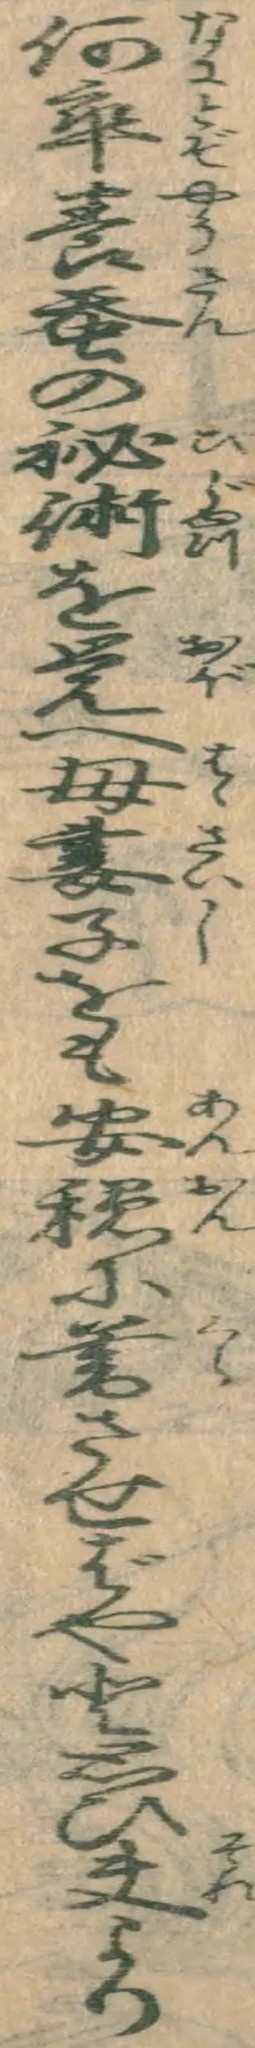何卒養蚕の秘術を覚ヘ母妻子をも安穏に暮させばやと思ひ夫より
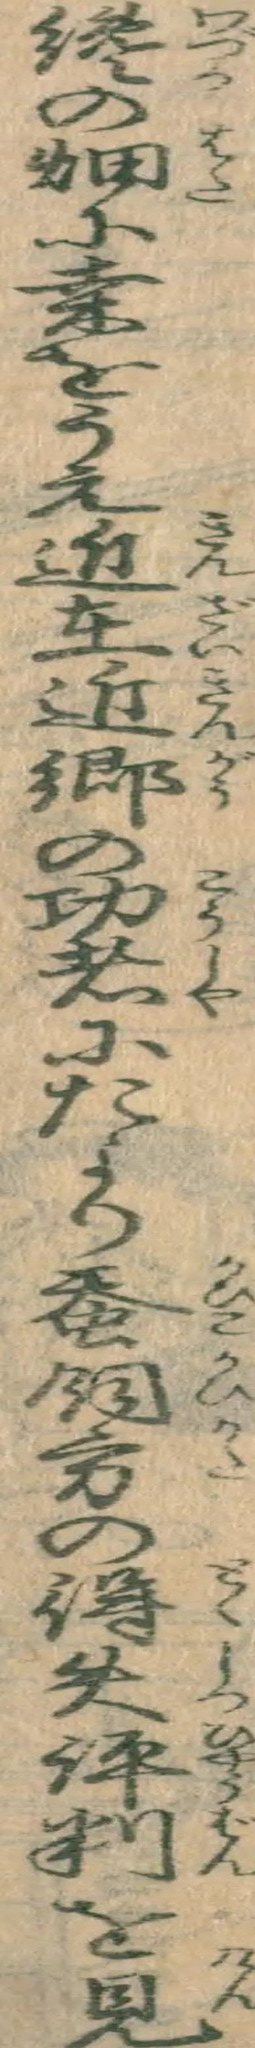纔の畑に桑をうえ近在近郷の功者にたより蚕飼方の得失評判を見
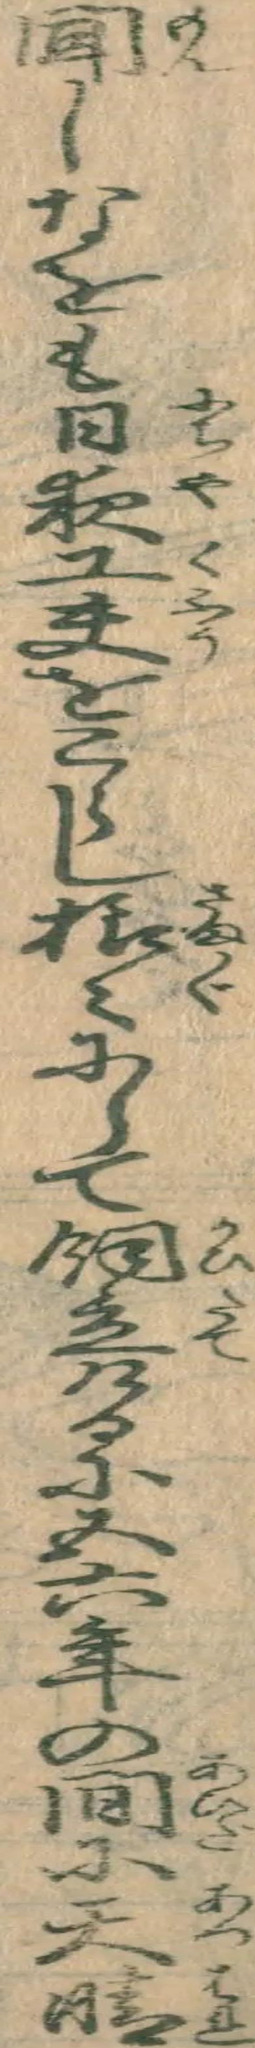聞しなをも日夜工夫をこらし様々にして飼立けるに五六年の間に天晴
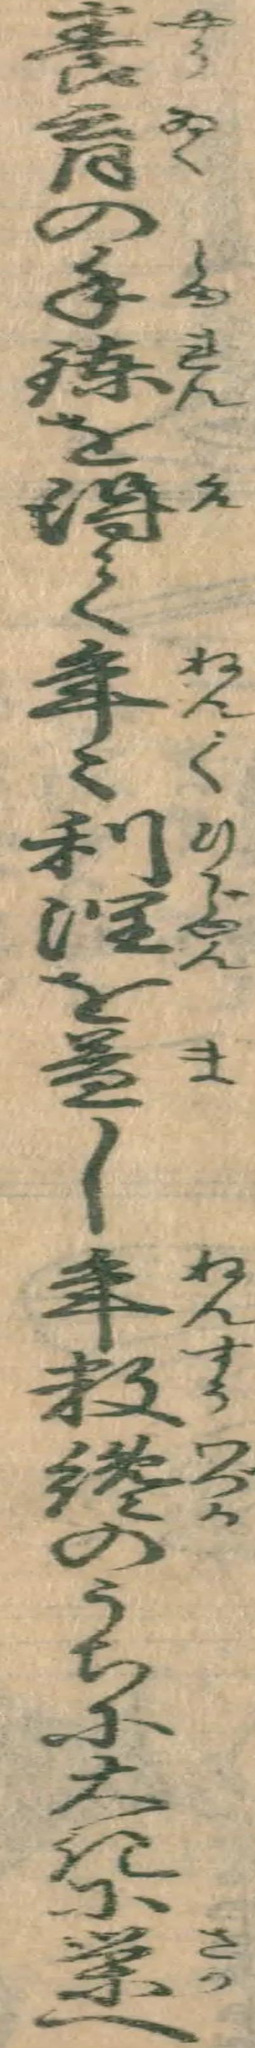養育の手錬を得て年々利潤を益し年数纔のうちに大きに栄へ
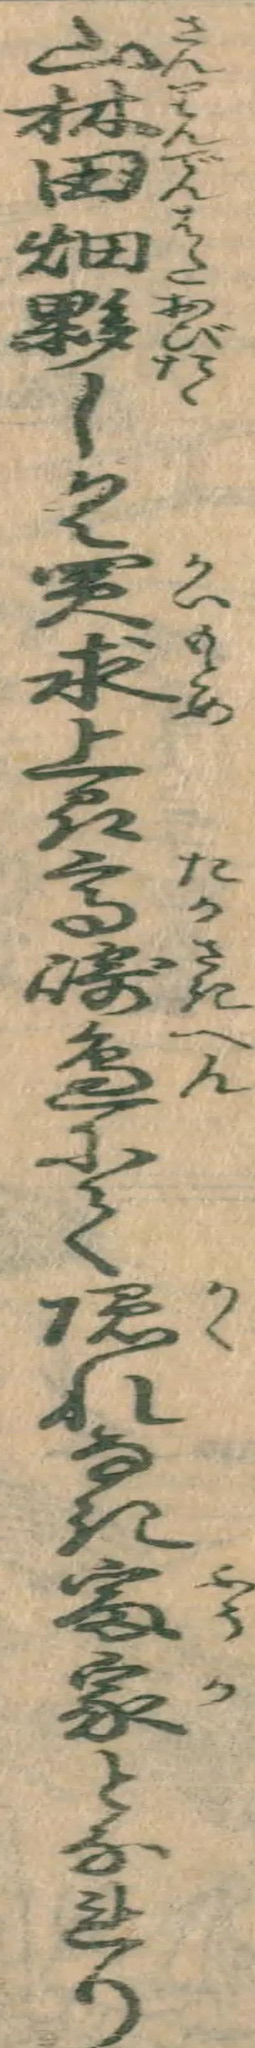山林田畑夥しく買求上州高崎辺にて隠れなき富家となれり
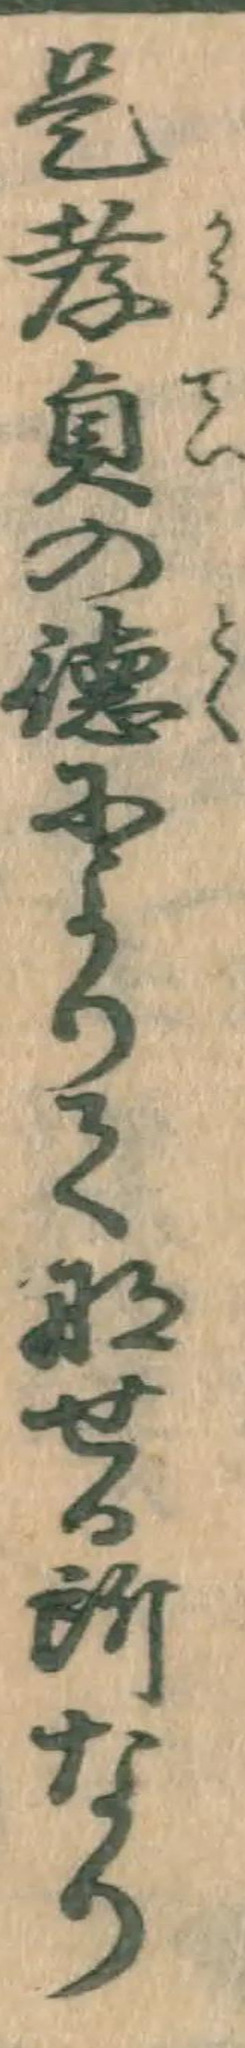是孝貞の徳によりてなせる所なり
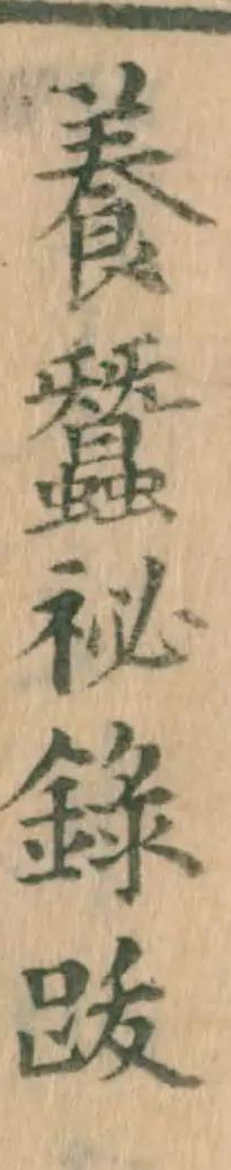養蚕秘録跋
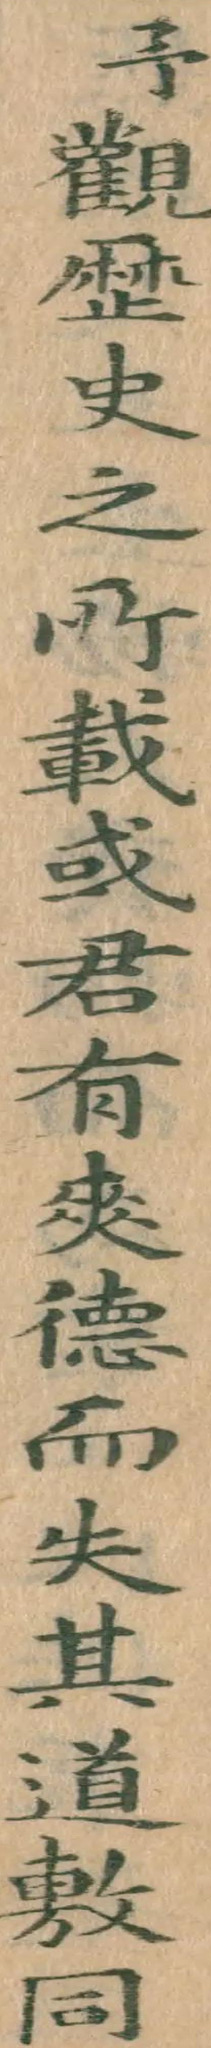予観歴史之所載或君有爽徳而失其道敷同
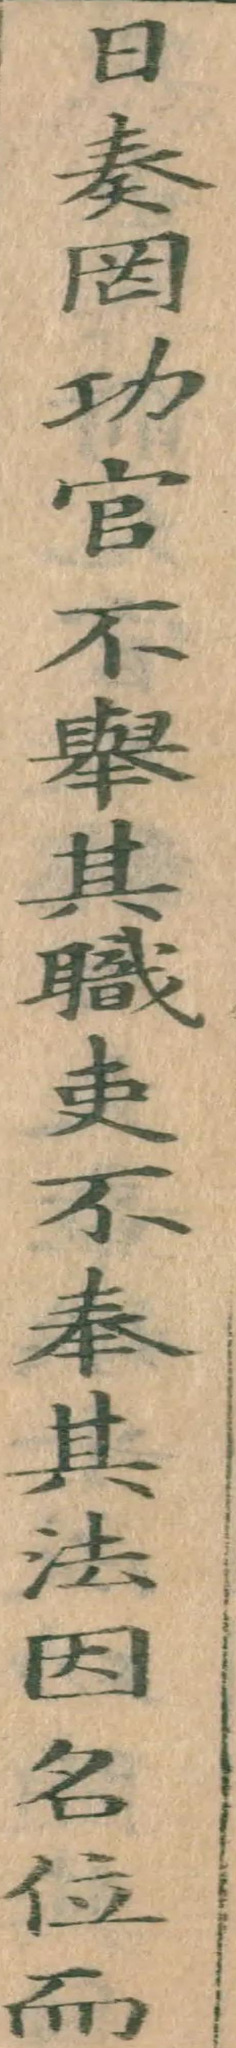日奏罔功官不擧其職吏不奉其法因名位而
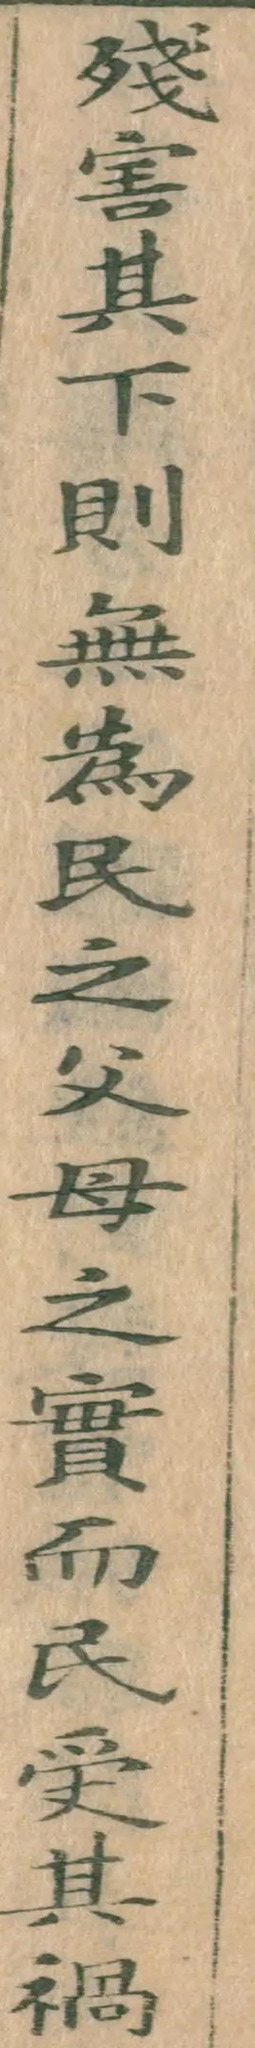残害其下則無為民之父母之実而民受其禍
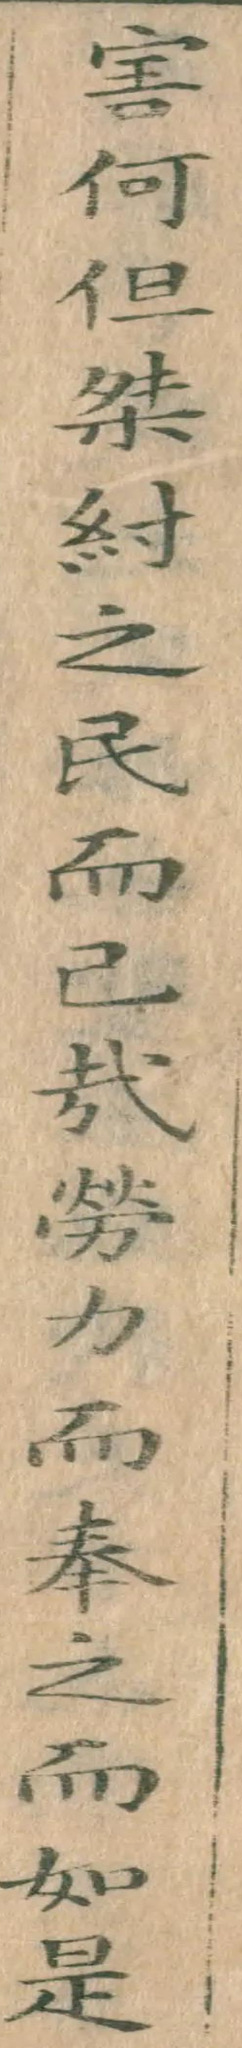害何但桀紂之民而已哉勞力而奉之而如是
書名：養蚕秘録 3巻. [3]
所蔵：国立国会図書館 National Diet Library, JAPAN
